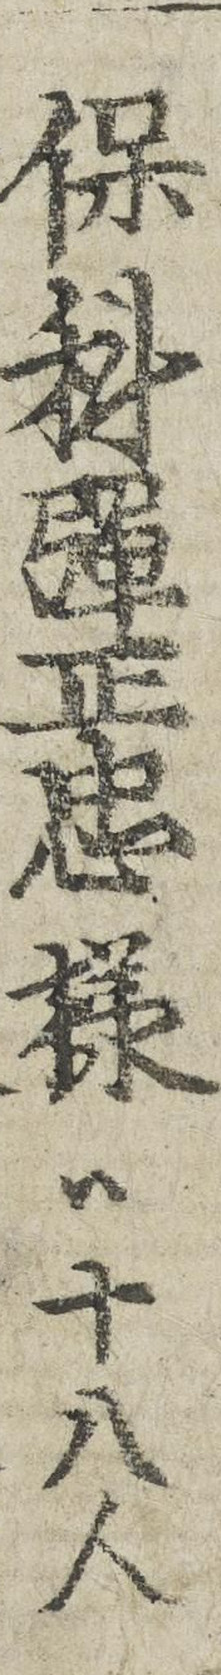保科弾正忠様〻十八人
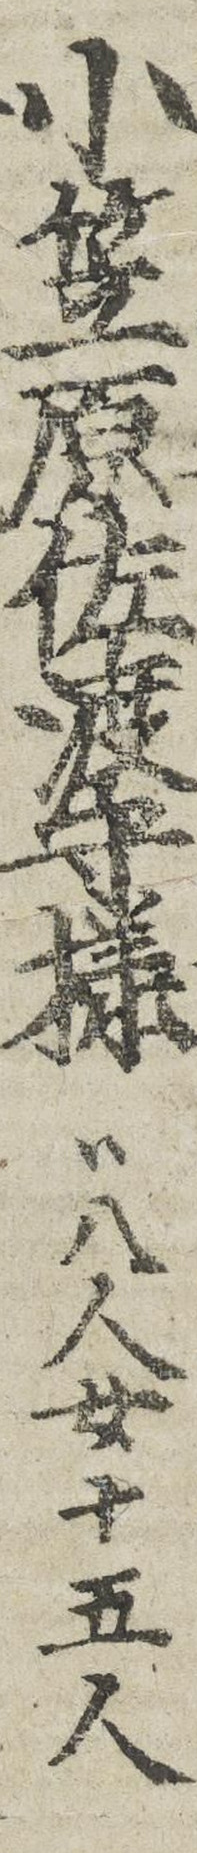小笠原佐渡守様〻八人女十五人
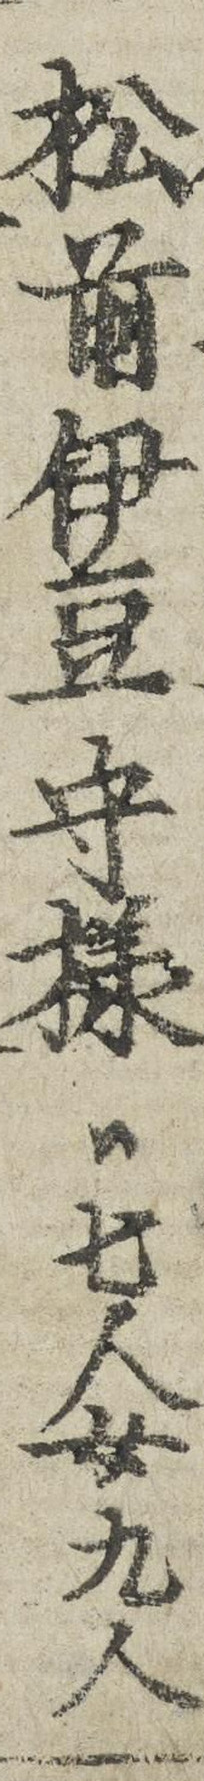松前伊豆守様〻七人女九人
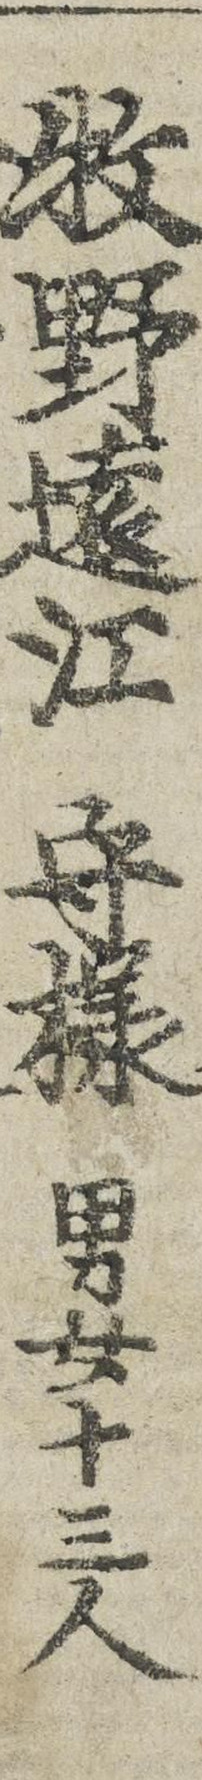牧野遠江守様男女十三人
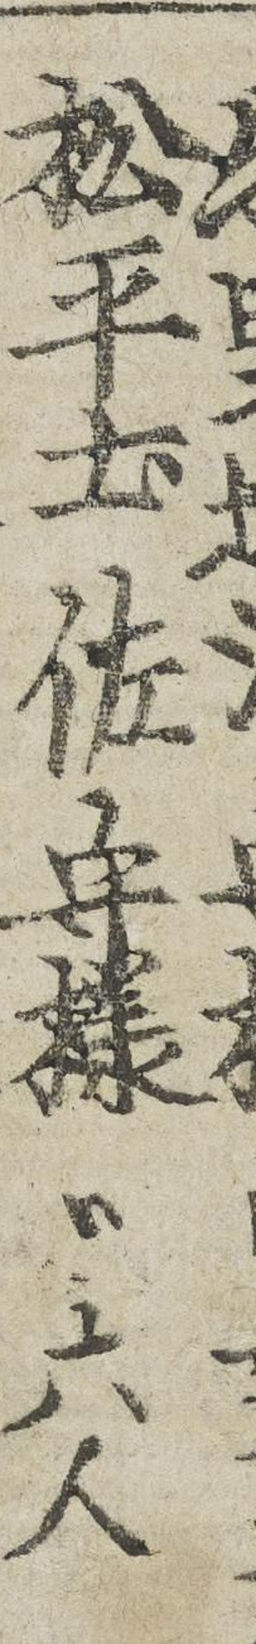松平土佐守様〻六人
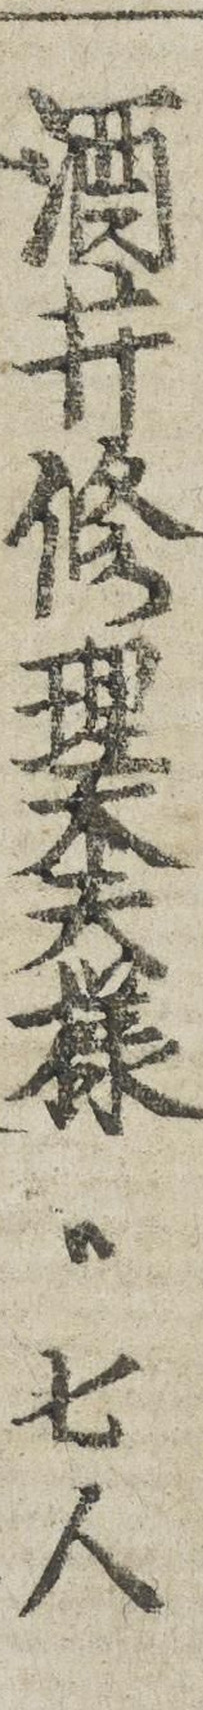酒井修理大夫様〻七人
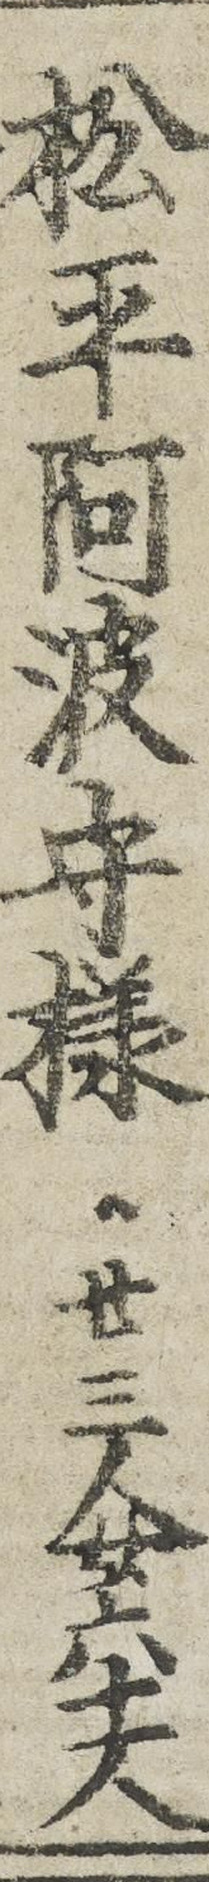松平阿波守様〻廿三人女六十一人
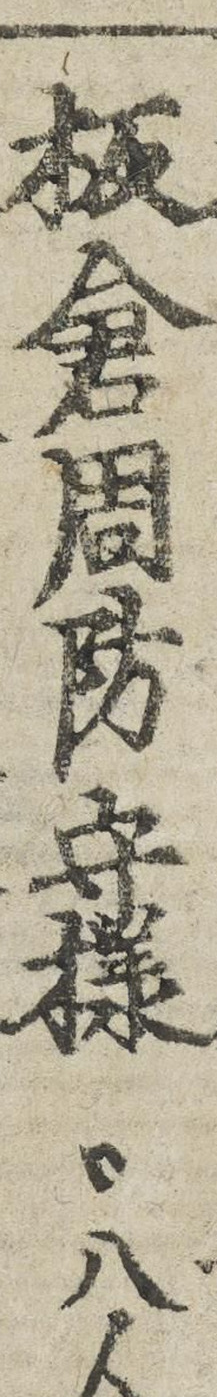板倉周防守様〻八人
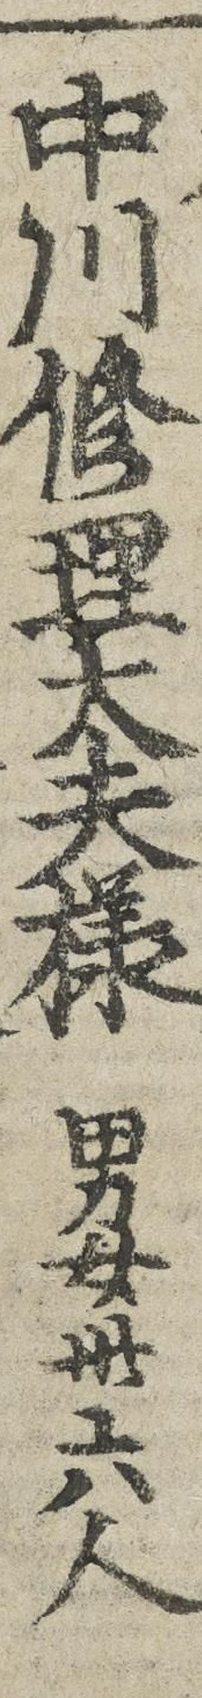中川修理大夫様男女三十六人
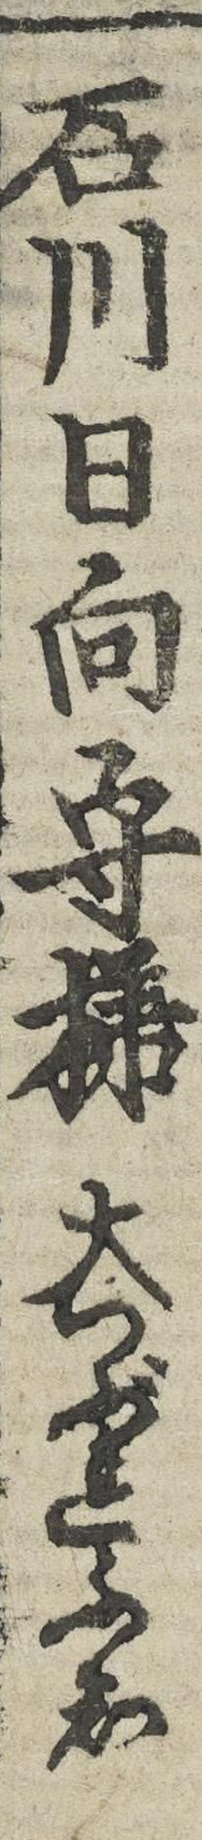石川日向守様大つぶれ不知
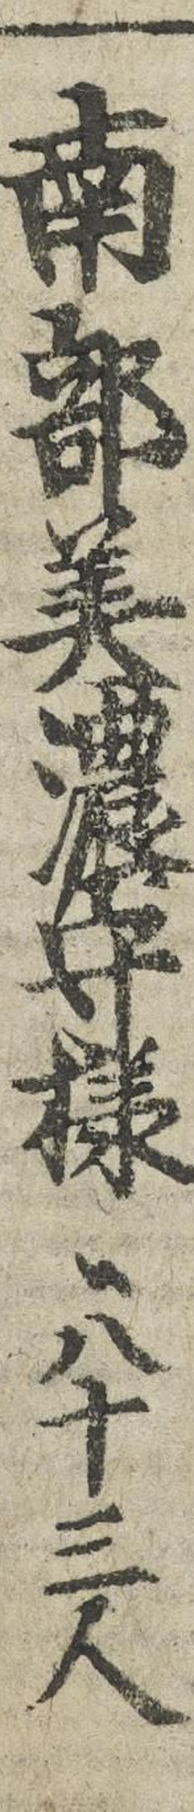南部美濃守様〻八十三人
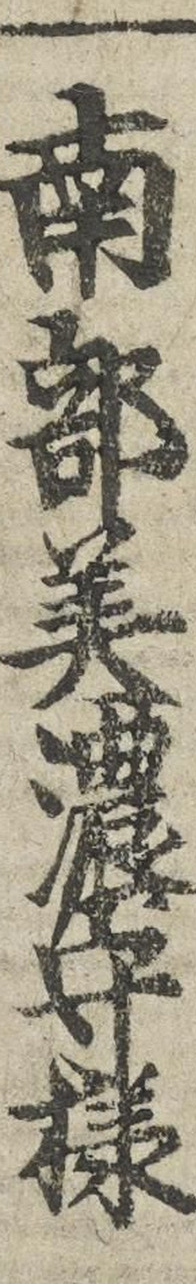南部信濃守様〻
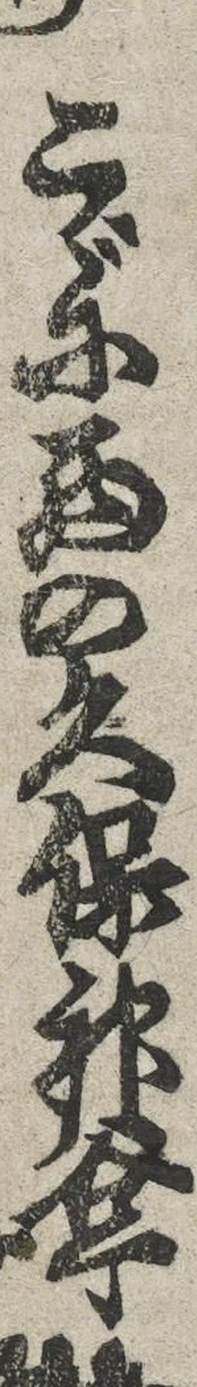こゞに西の久保神谷丁
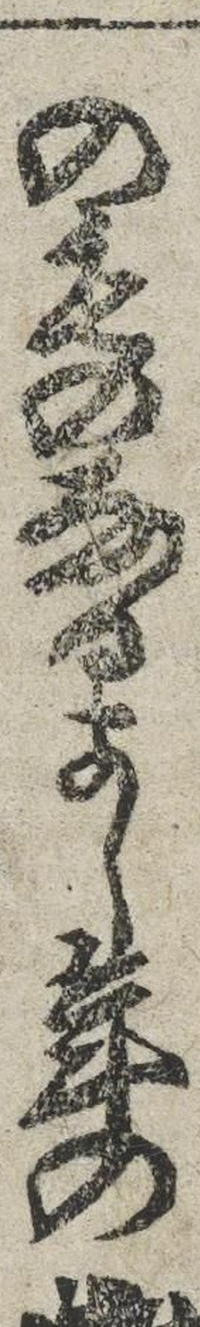のものなるよし年の
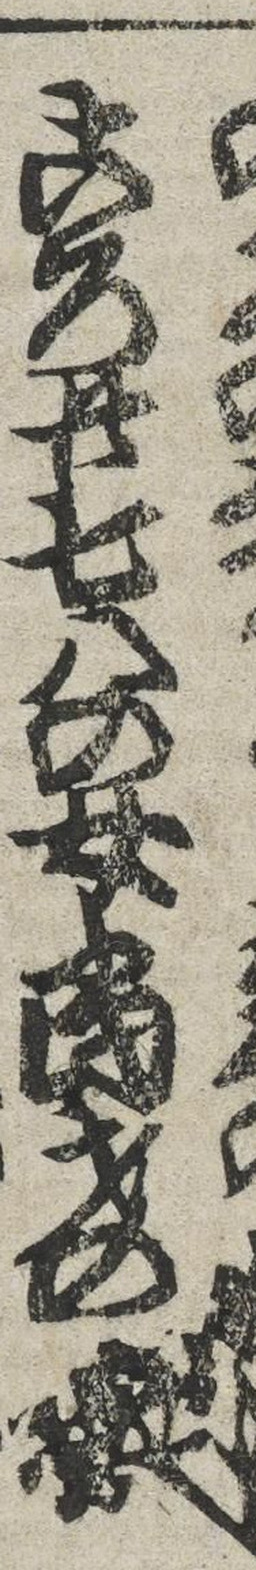ころ廿七八の女当才の
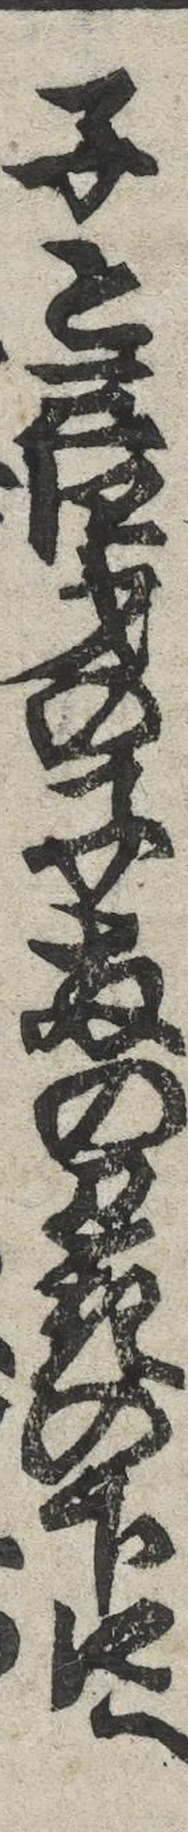子と三四才の子両のわきの下口へ
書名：[明暦大火に関する冊子]
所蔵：東京大学地震研究所図書室 Earthquake Research Institute Library, The University of Tokyo, JAPAN
